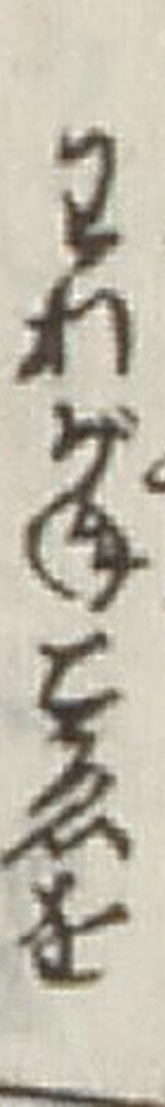われがねこゑを
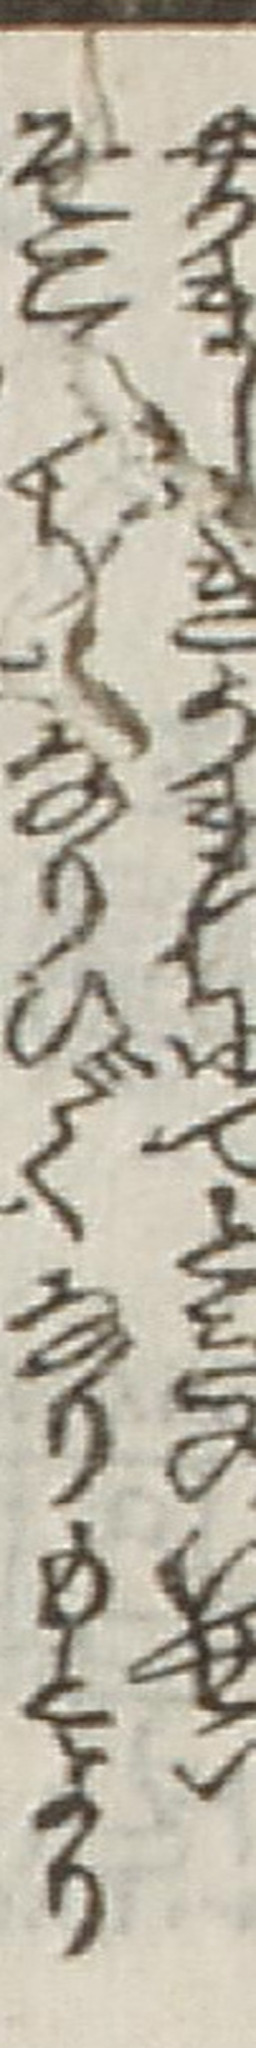そこら？ぢ？なりひゞくなりもとより
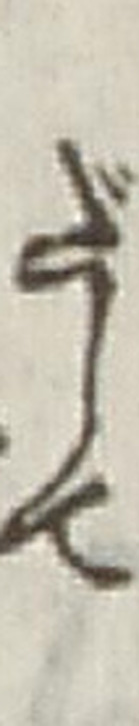だして
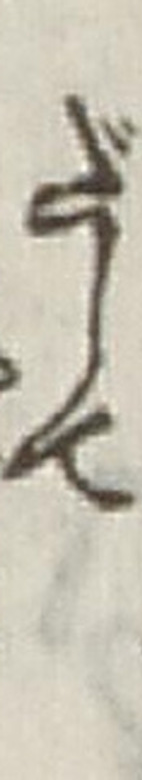だして
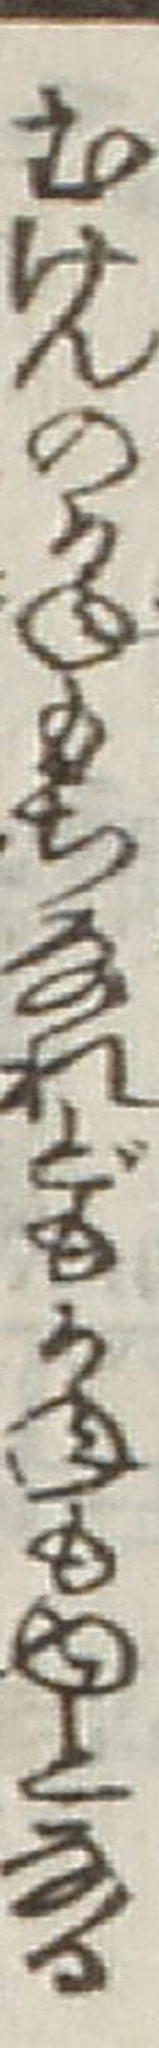むけんのかねもちなれどもかねもゆとなる
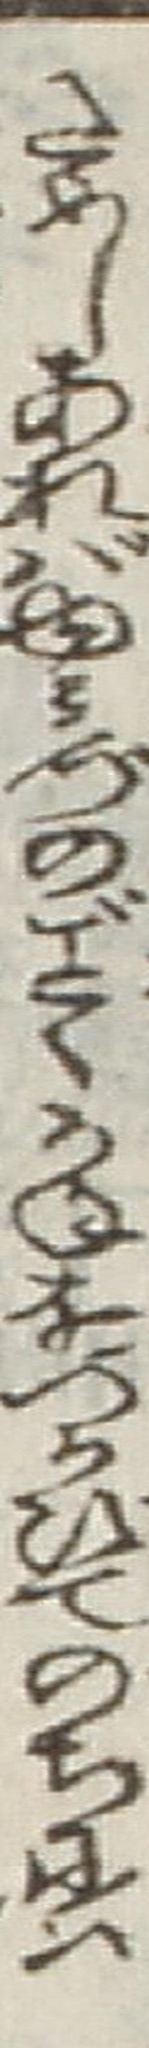ためしあればゆみづのごとくかねをつかひてのちには
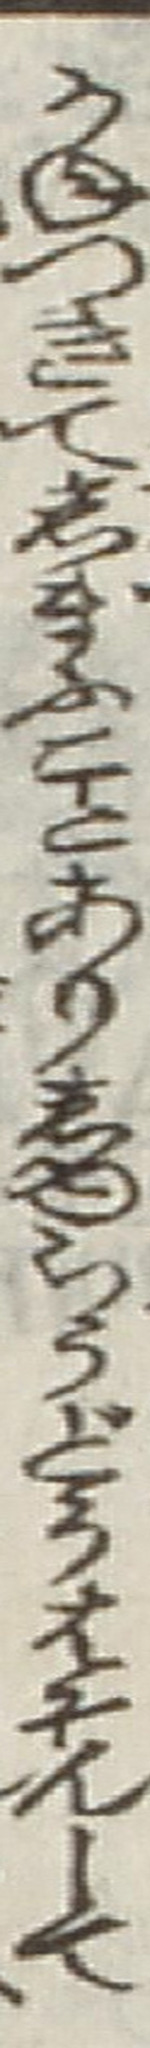かねつきてしまふことありしゆらうどうはんして
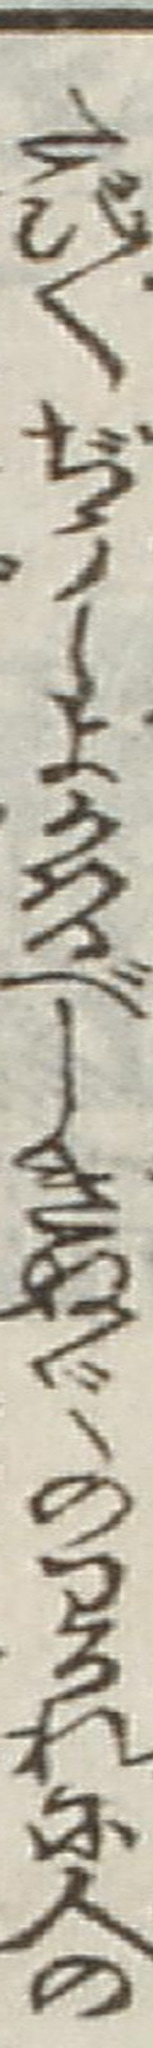たび〳〵ぢうしよかはるべしきぬ〴〵のわかれに人の
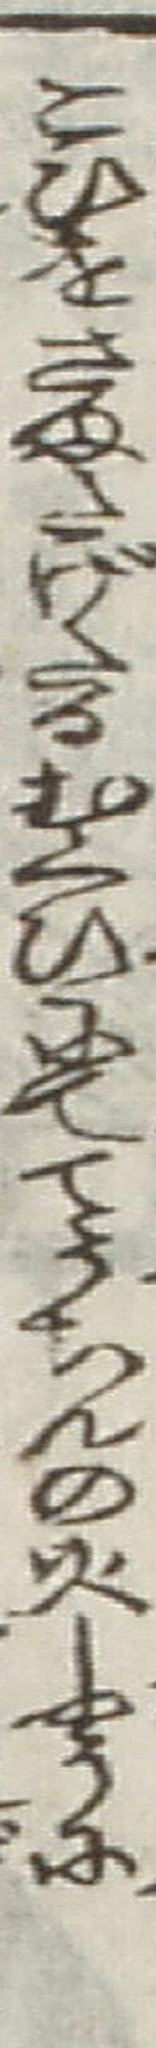こひをさまたげたるむくひにててうちんの火しやうに
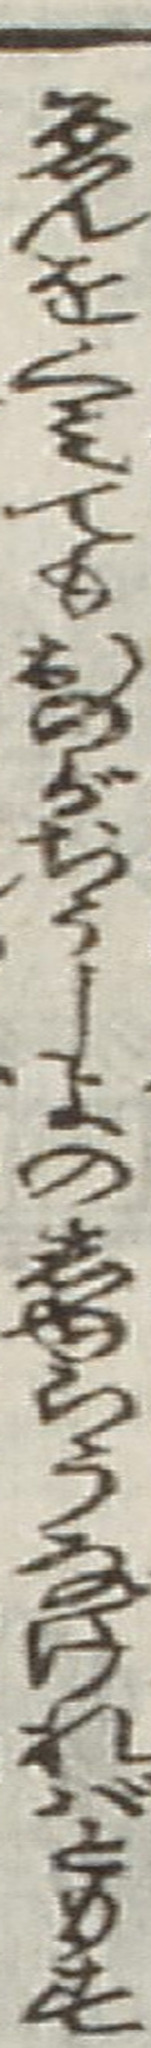ゑんをくみてもおのがぢうしよのしゆらうなければともす
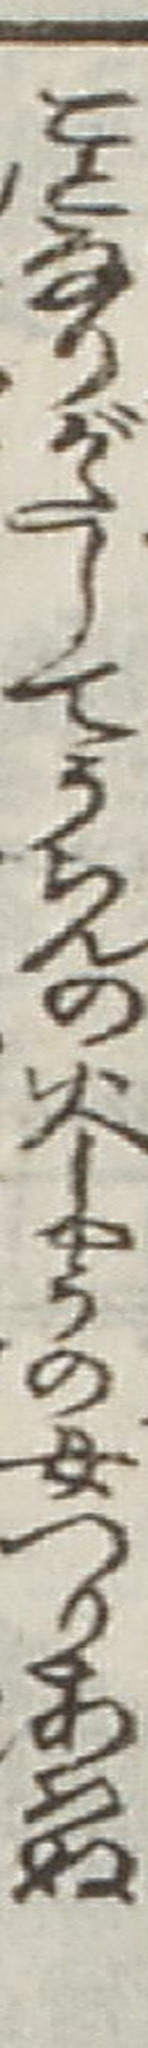ことなりがたしてうちんの火しやうの女つりあはぬ
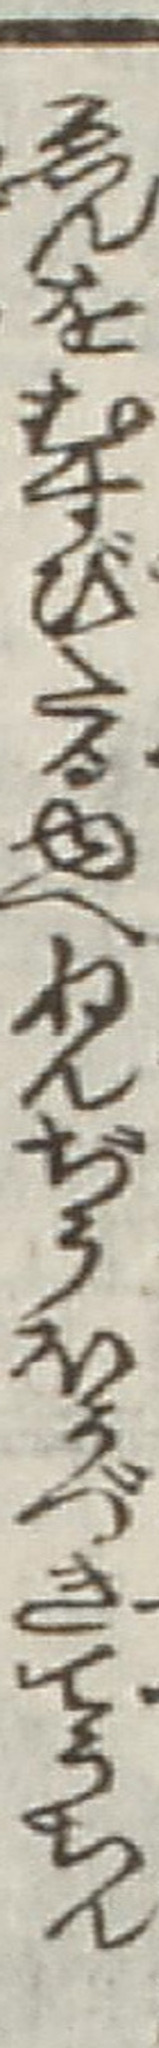ゑんをむすびたるゆへねんぢうほうづきてうちん
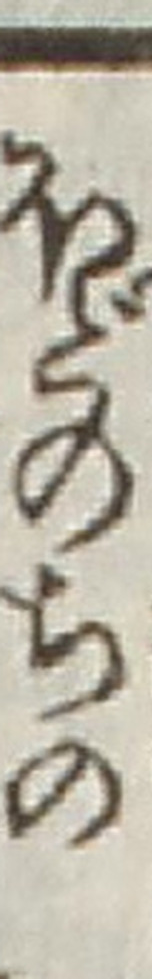ほどのちの
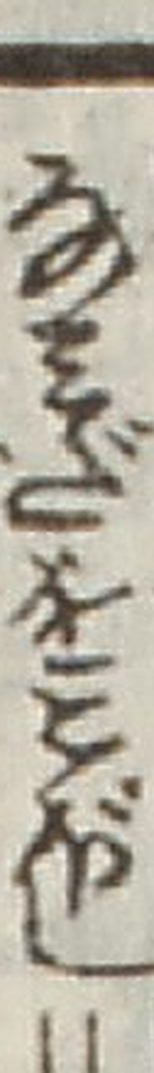なみだをこぼし
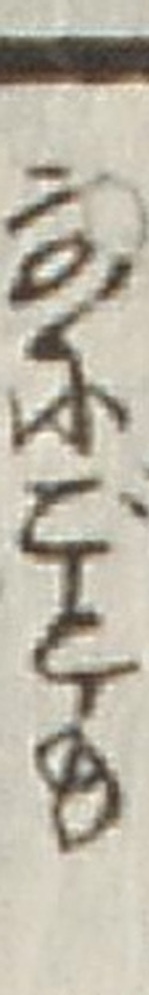なにごとも
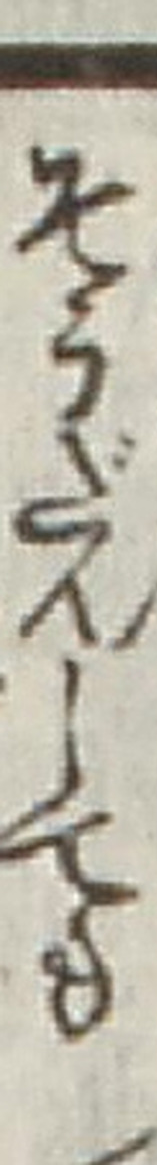そうだんしても
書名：三世相出雲當座帳　上下冊
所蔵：東京大学地震研究所図書室 Earthquake Research Institute Library, The University of Tokyo, JAPAN
